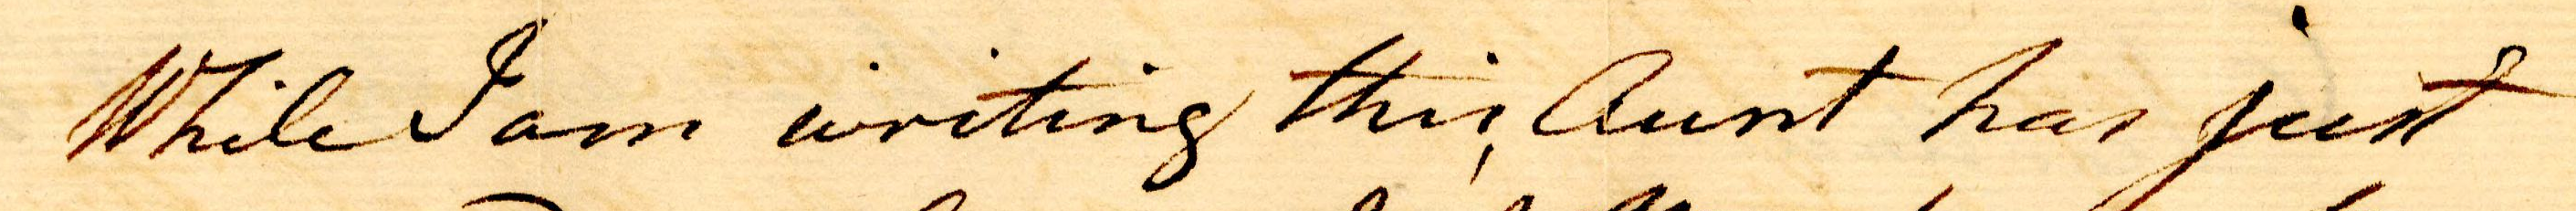While I am writing this, Aunt has just
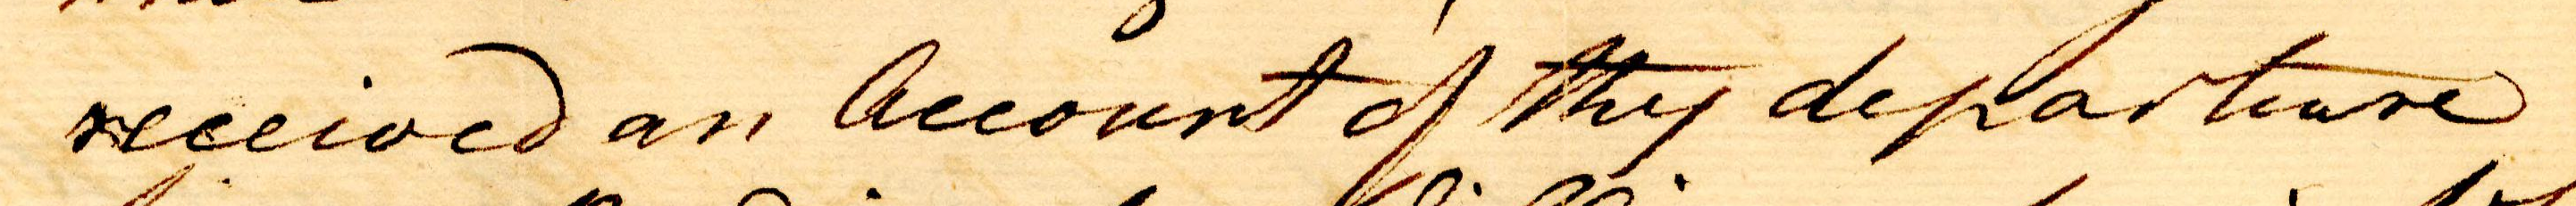received an Account of thy departure
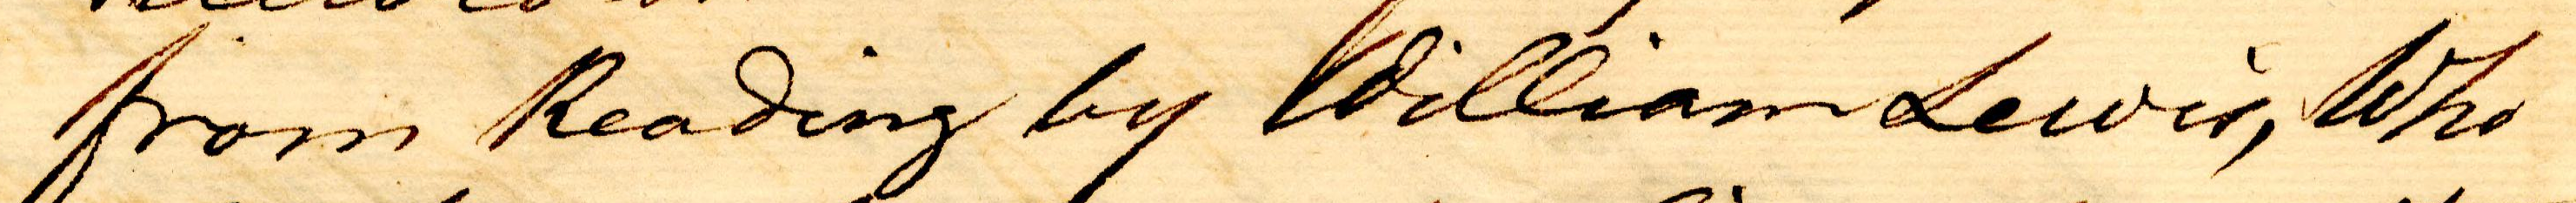from Reading by William Lewis, Who
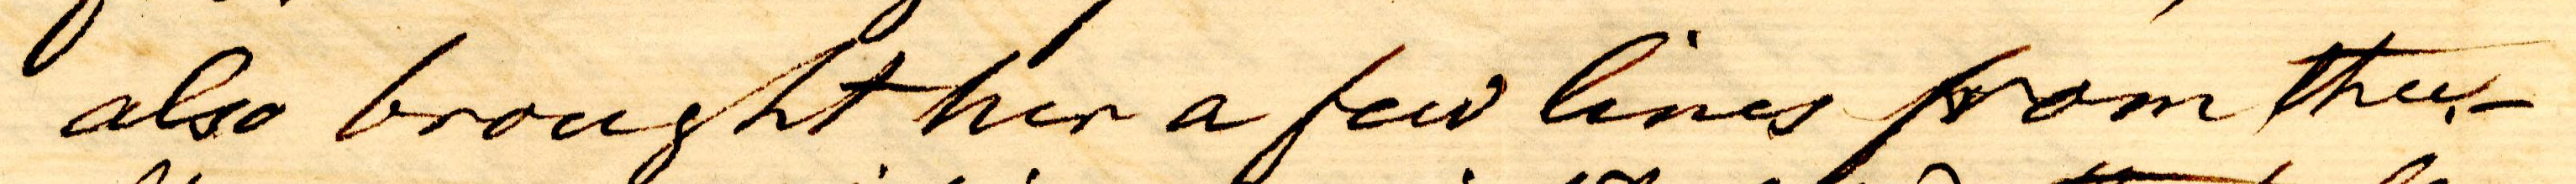also brought her a few lines from thee.-
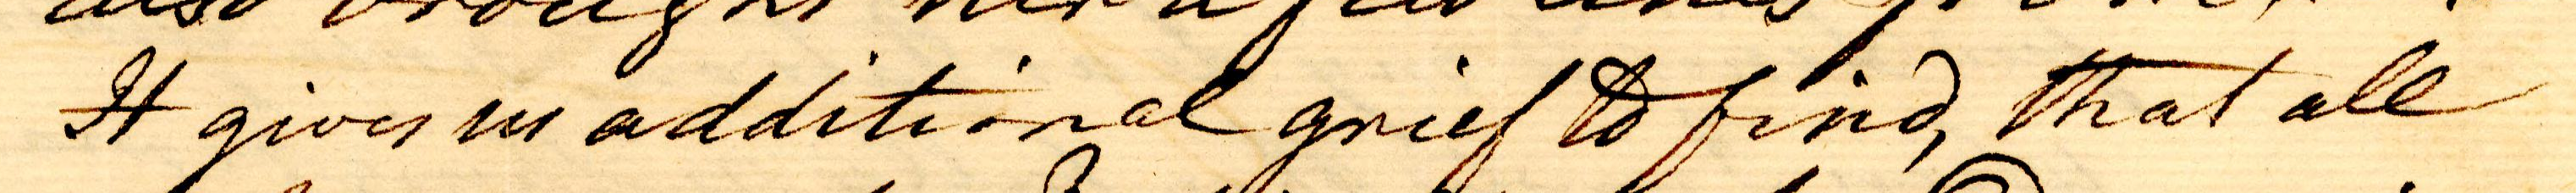It gives us additional grief to find, that all
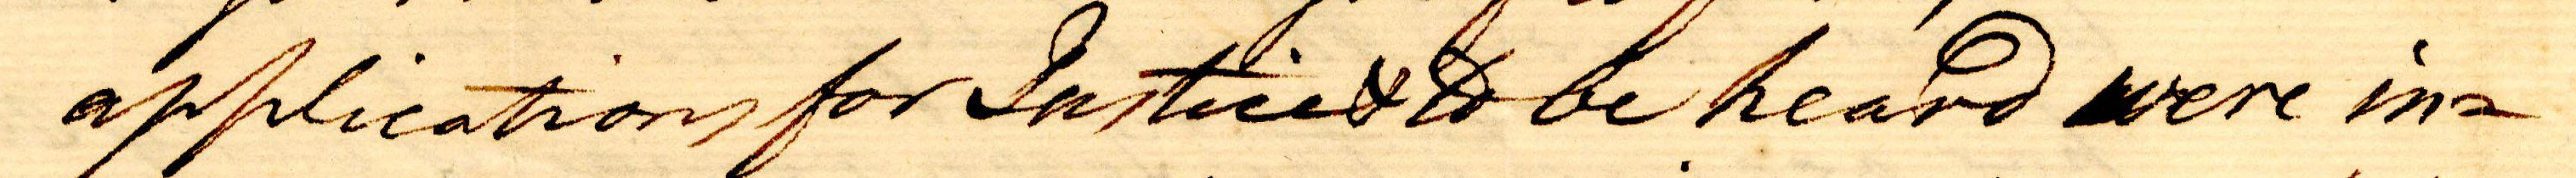applications for Justice & to be heard were in-
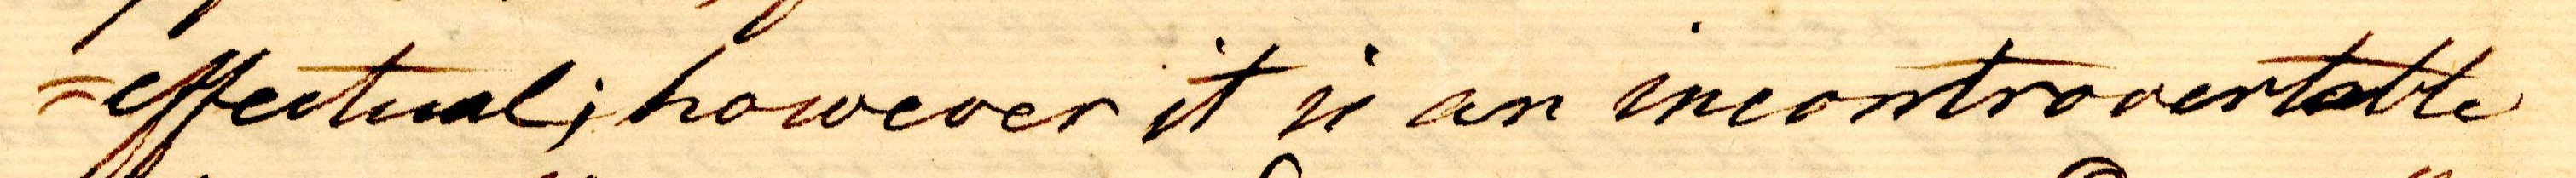-effectual; however it is an incontrovertable
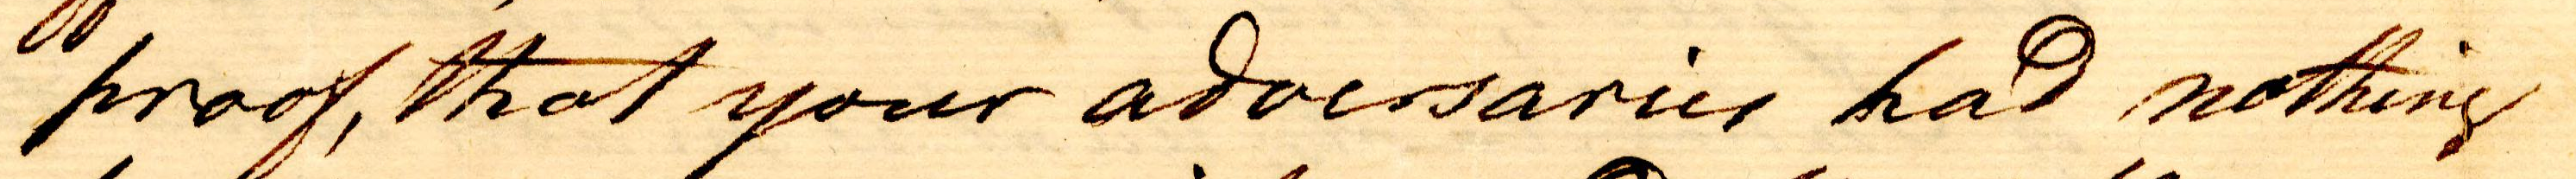proof, that your adversaries had nothing
